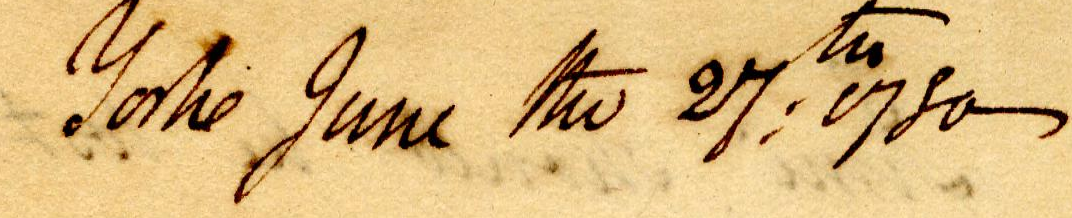Yorke June the 27^th. 1780
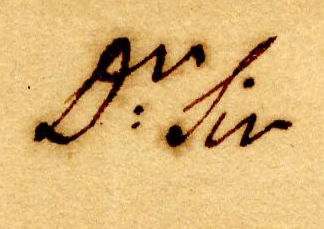D^r. Sir
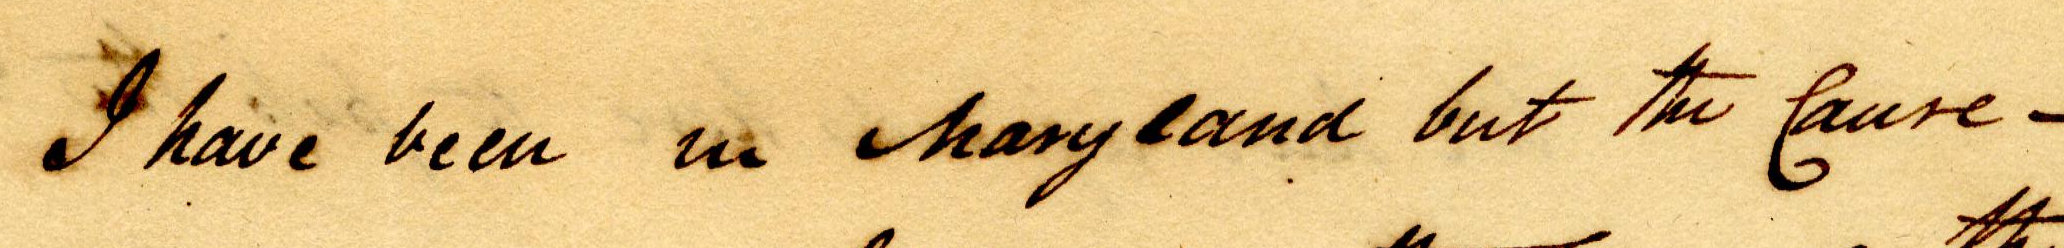I have been in Maryland but the Cause
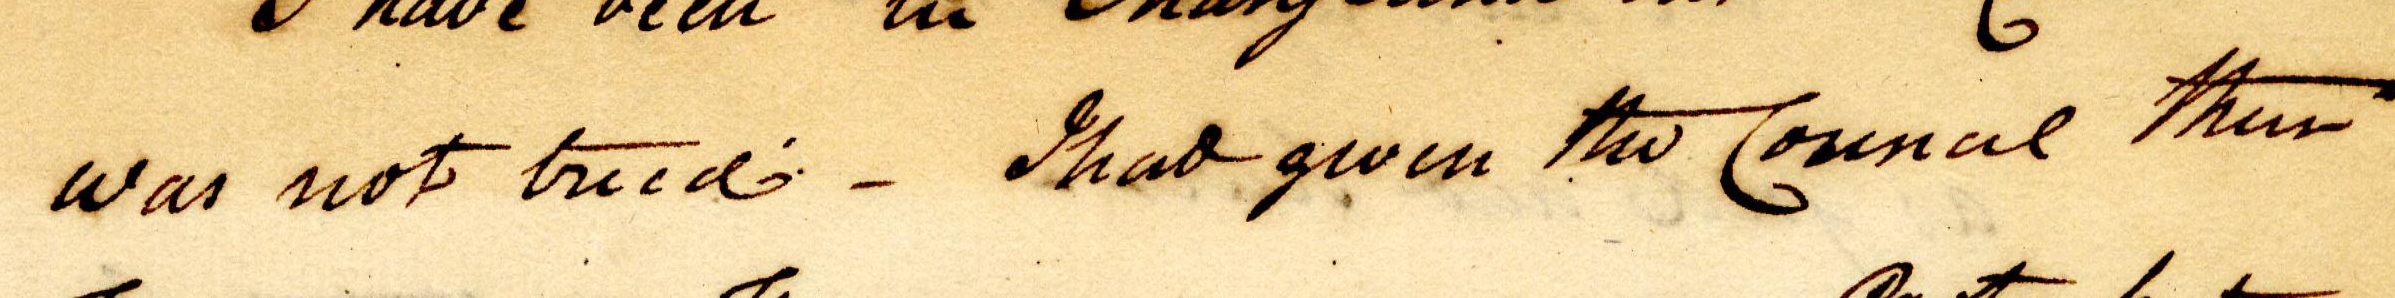was not tried- I had given the Council their
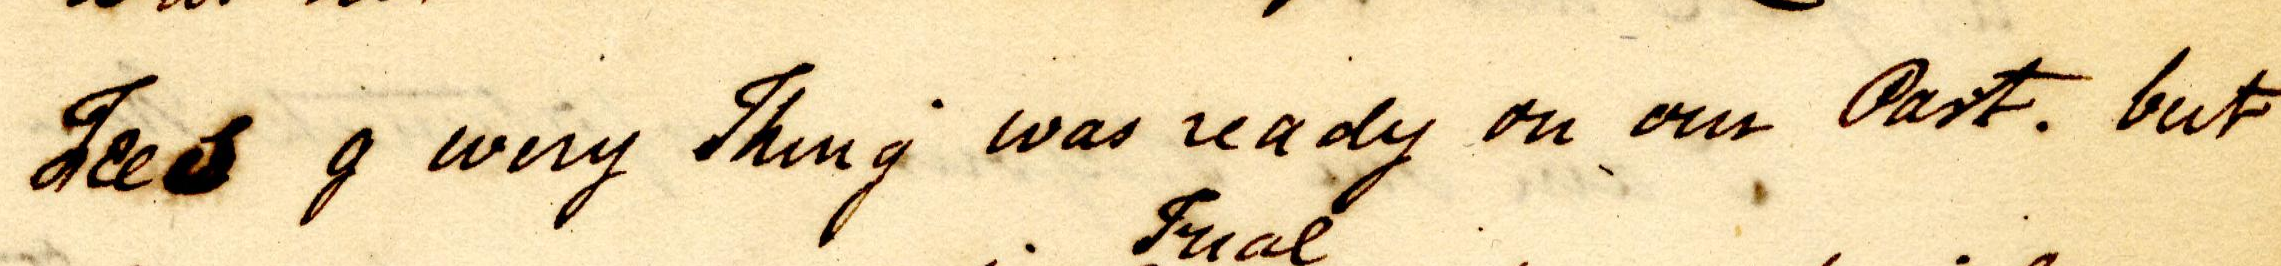Ice & every Thing was ready on our Part. but
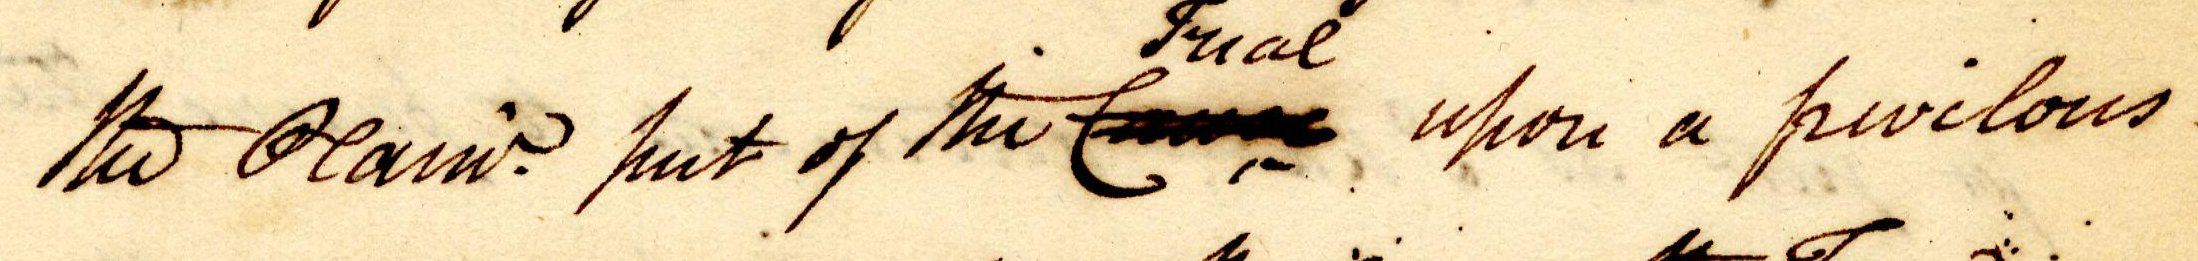the Plain^f. put of the Council ^ upon a frivolous
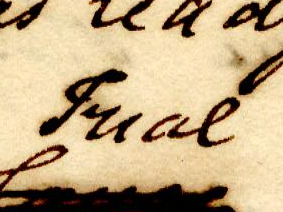Trial
